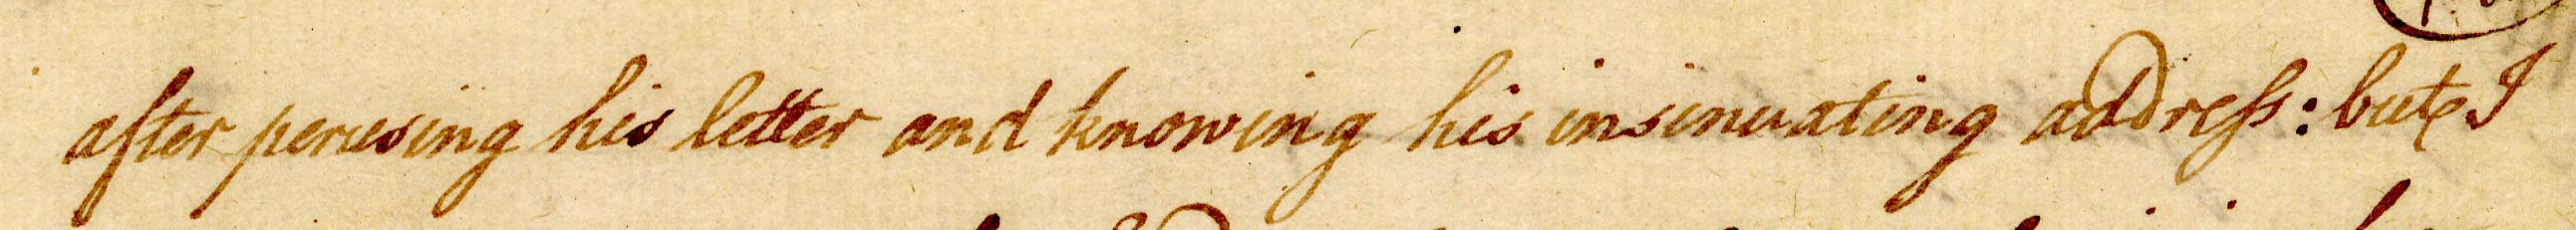after penning his letter and knowing his insinuating address: but I
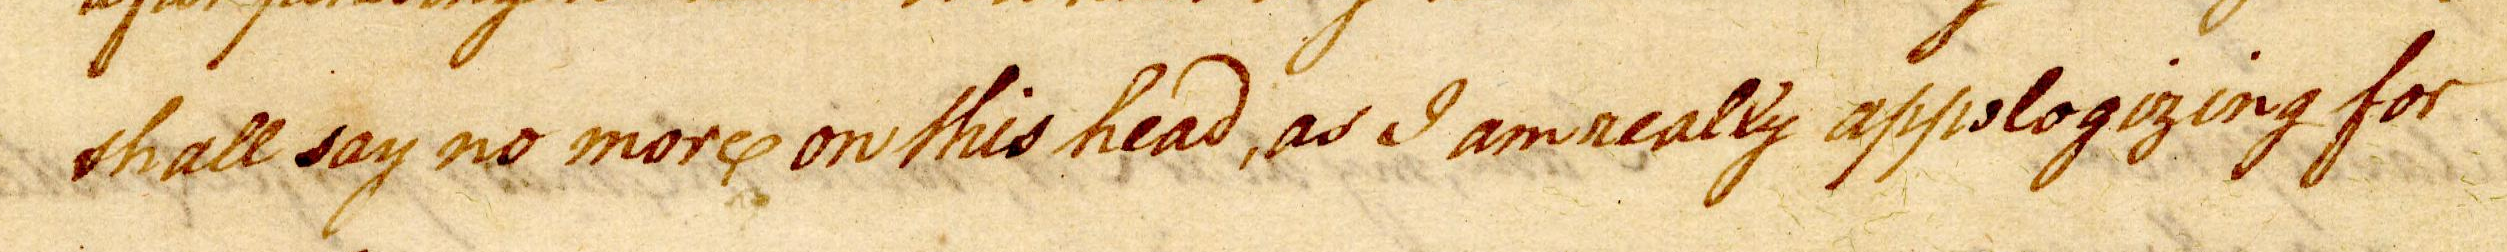shall say no more on this head, as I am really apologizing for
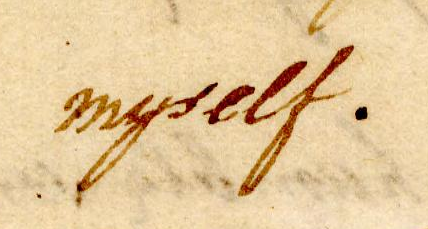myself.
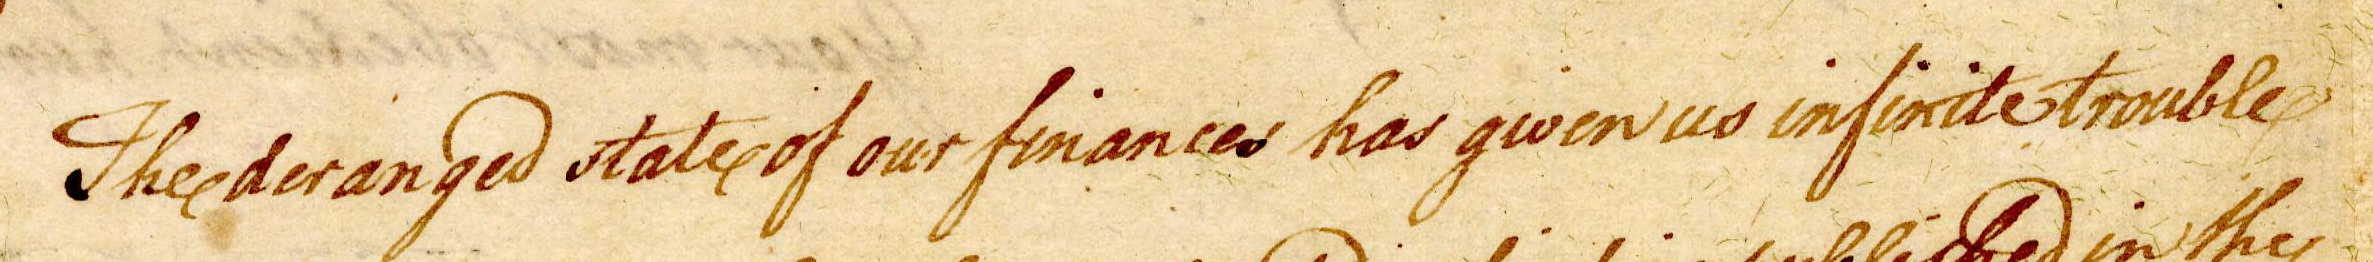The deranged state of our finances has given us infinite trouble
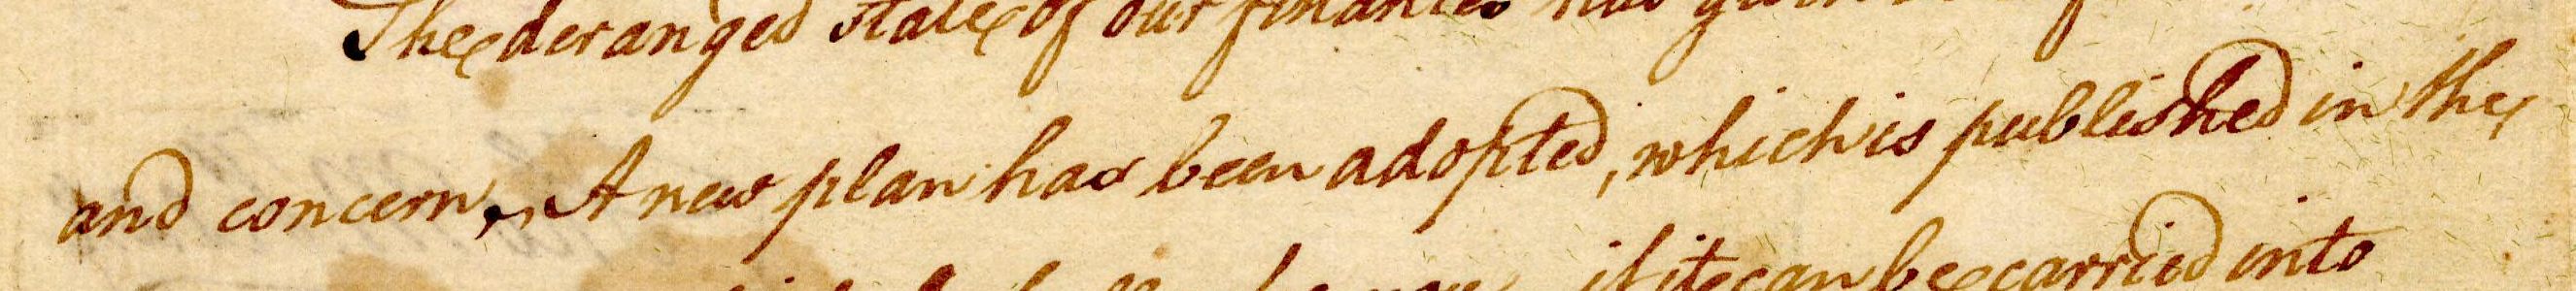and concern A new plan has been adopted, which is published in the
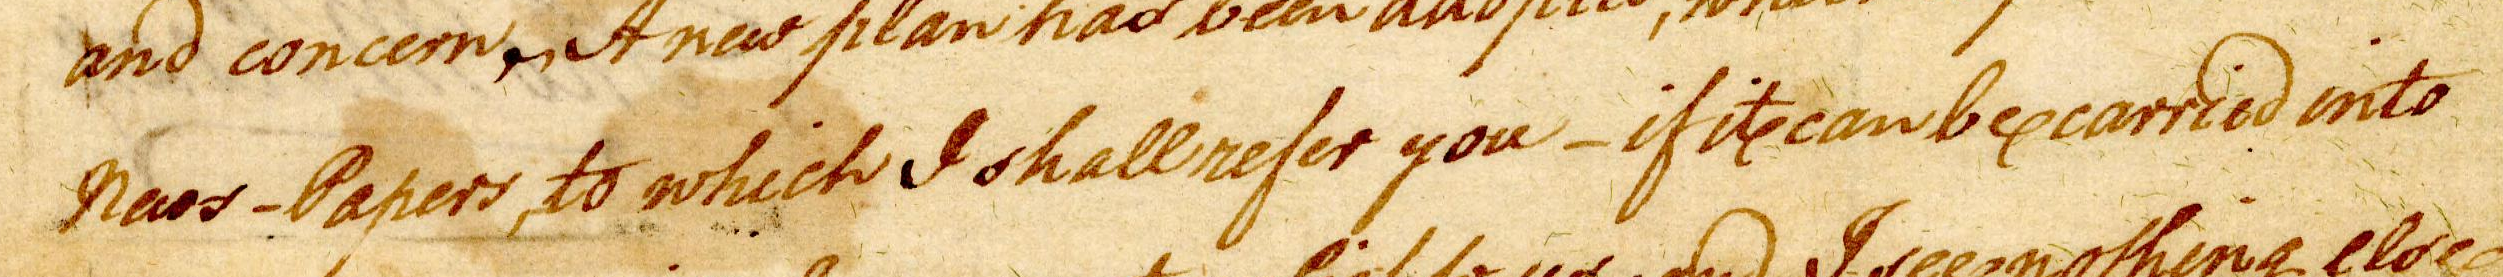News-Papers to which I shall refer you- if it can be carried into
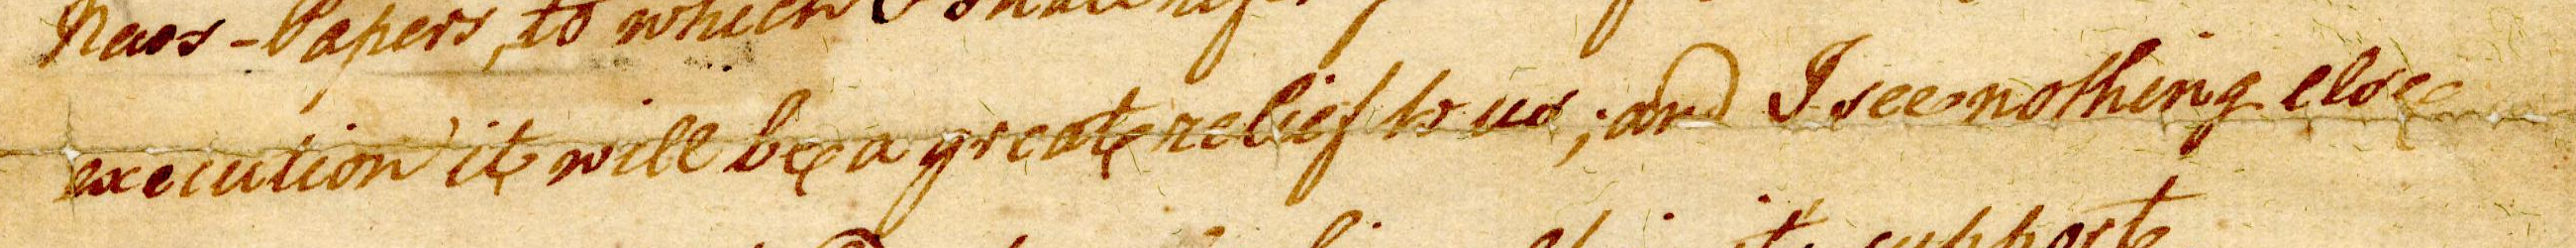execution it will be a great relief to us; and I see nothing else
